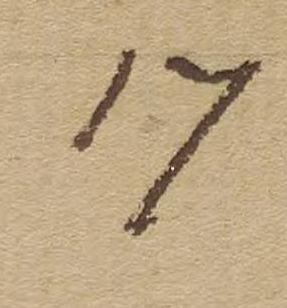17
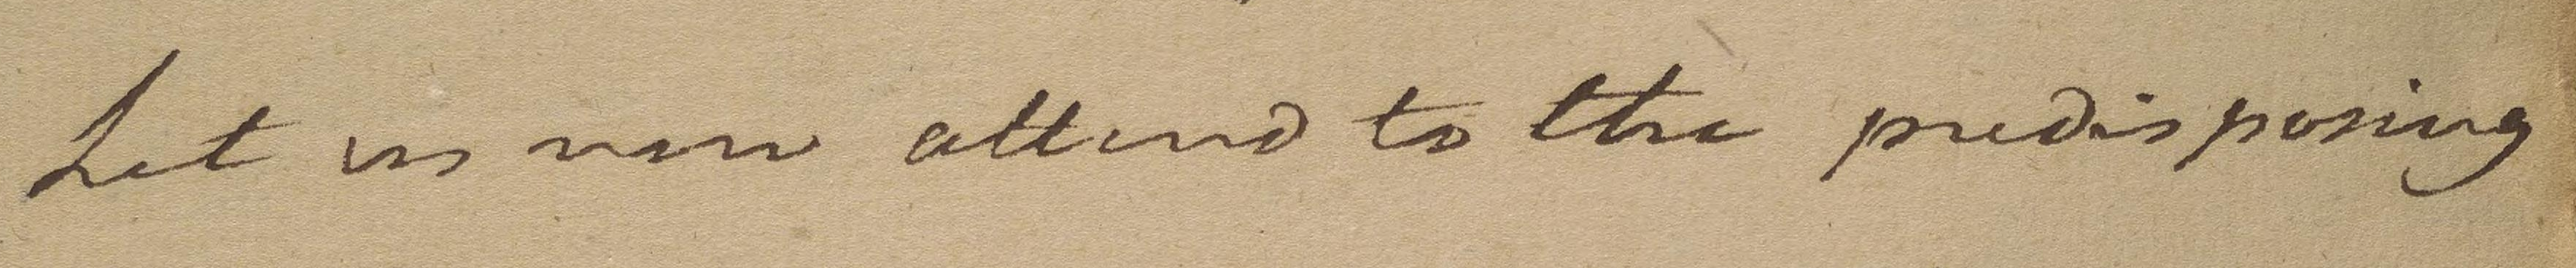Let us now attend to the predisposing
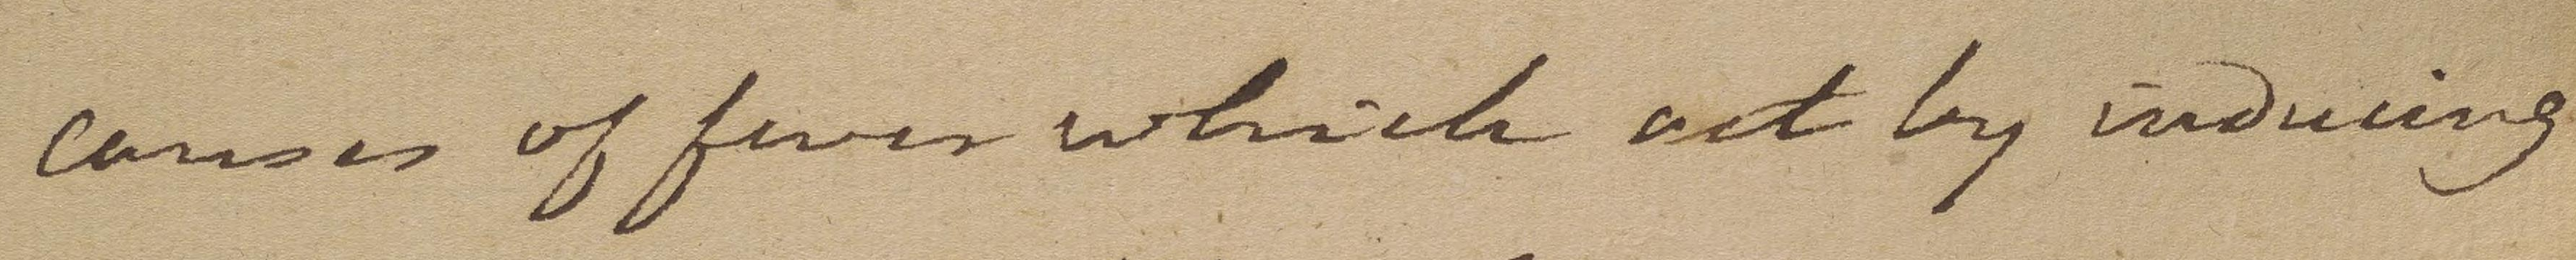causes of fever which act by inducing
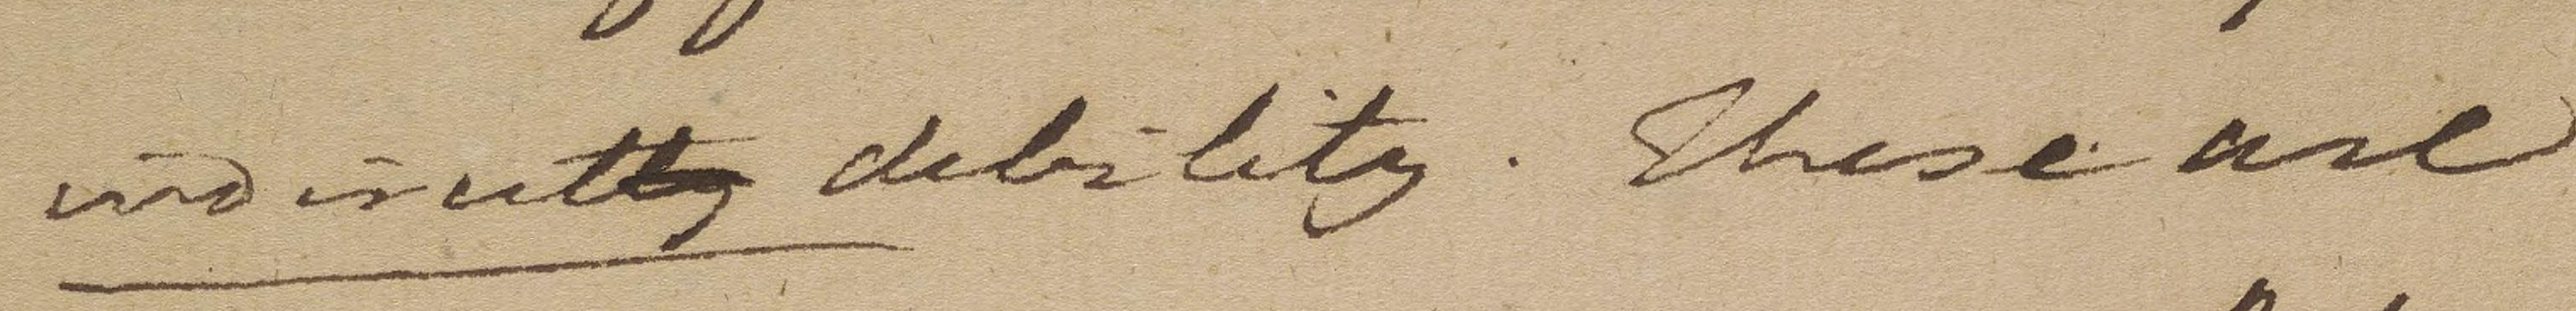indirect[ly] debility. These are
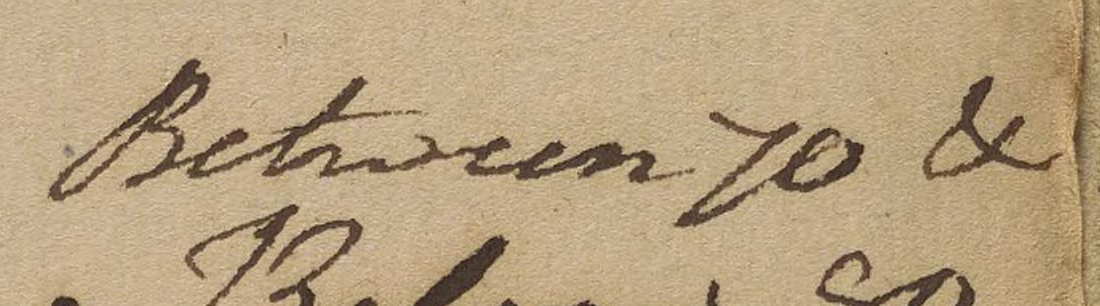Between 70 &
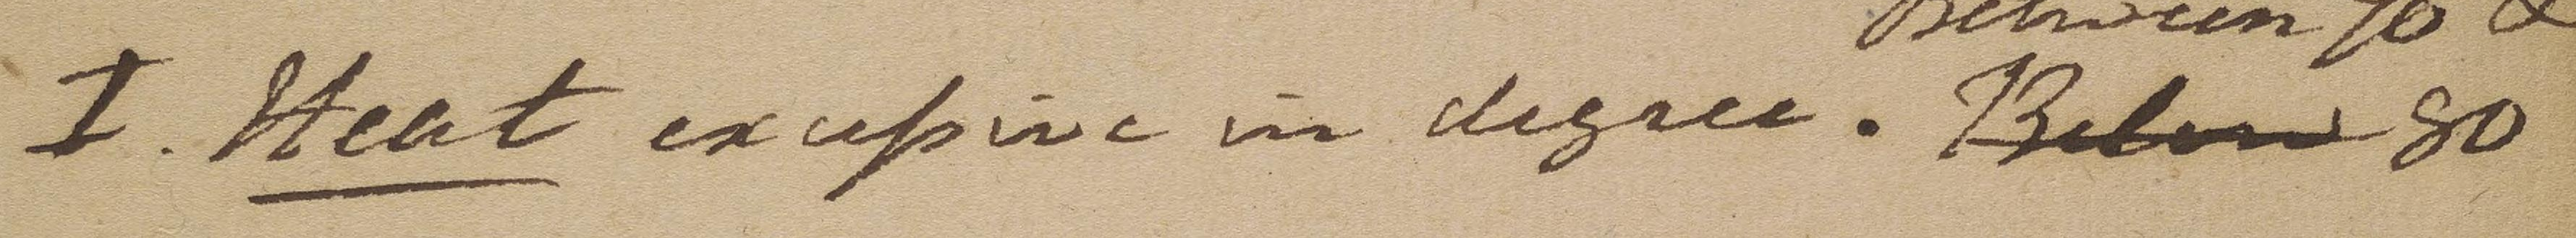I. Heat excessive in degree [Betw] 80
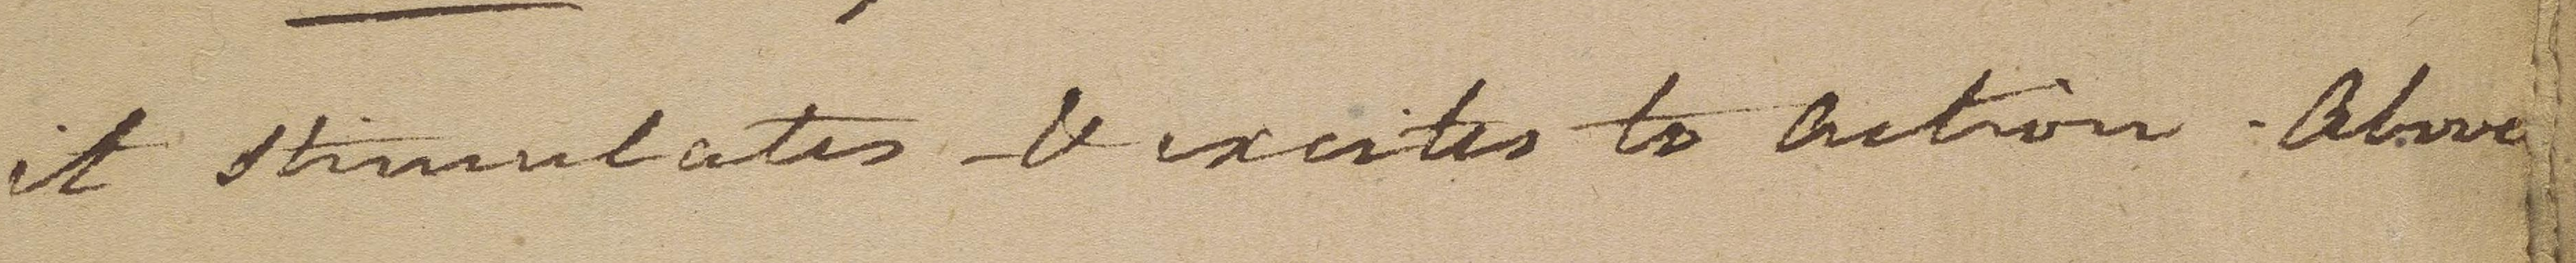It stimulates & excites to action Above
